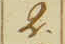2.
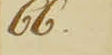66.
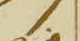1.
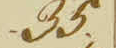35.
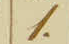1.
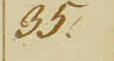35.
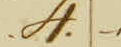4.
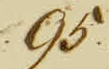95.
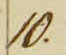10.
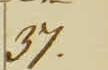37.
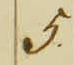5.
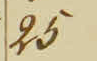25
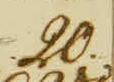20.
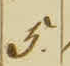5.
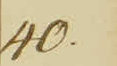40.
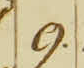9.
